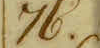76.
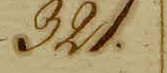321.
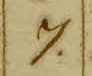7.
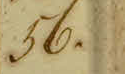56.
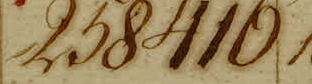258416
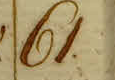61.
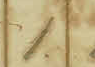1.
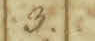3.
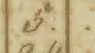5.
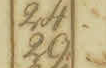29
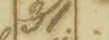31
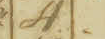4
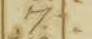7
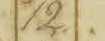12
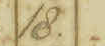18
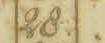28
